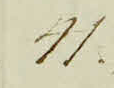41
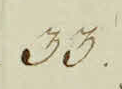33
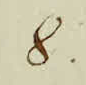8
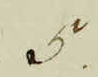5
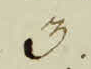3
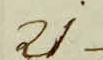21
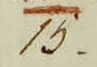15
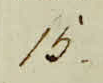15
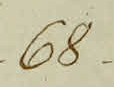68
